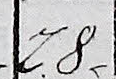28
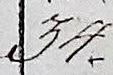34
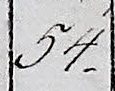54
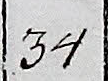34
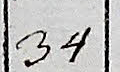34
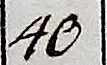40
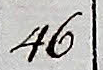46
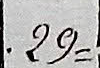29
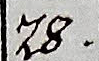28
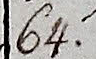54
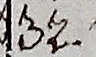32
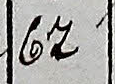62
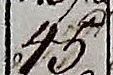45
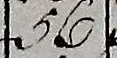56
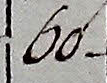60
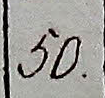50
